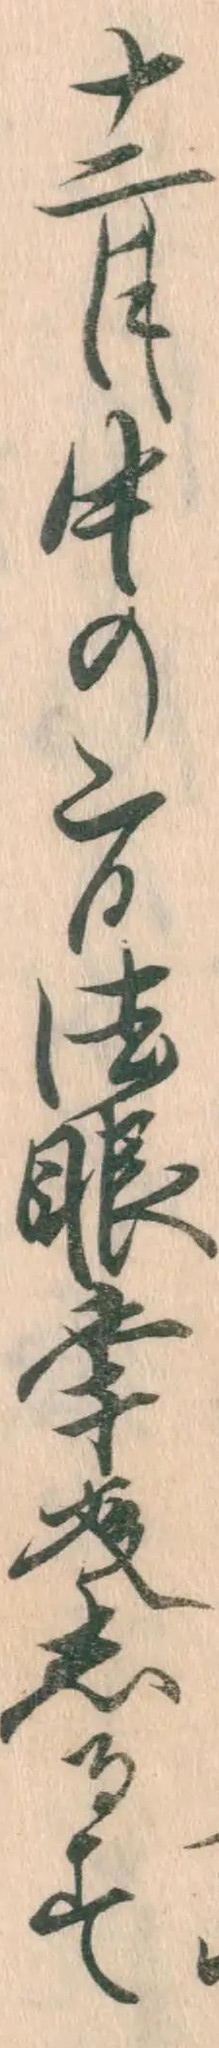十二月中の二日法眼李文しるす
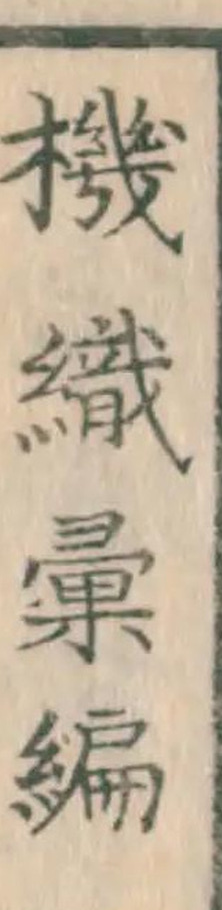機織彙編
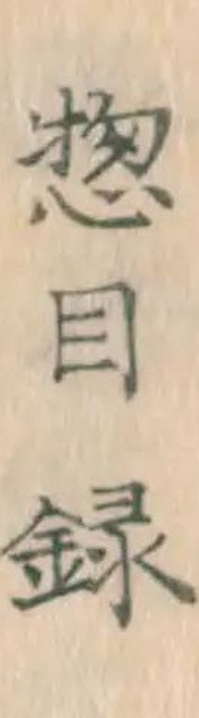惣目録
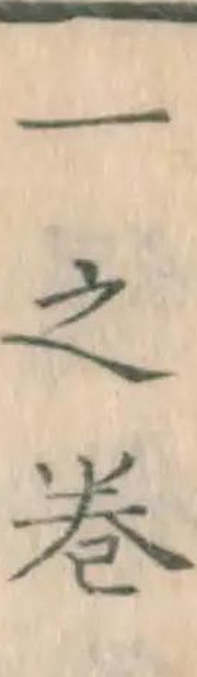一之巻
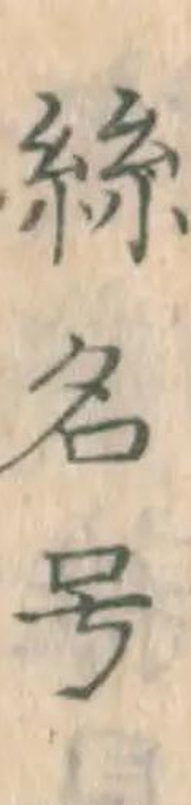糸名号
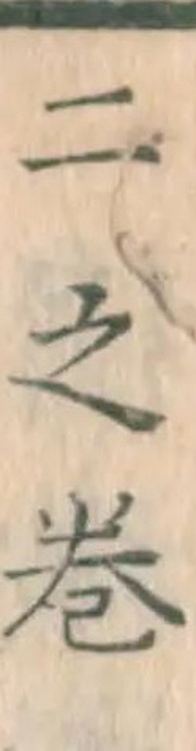二之巻
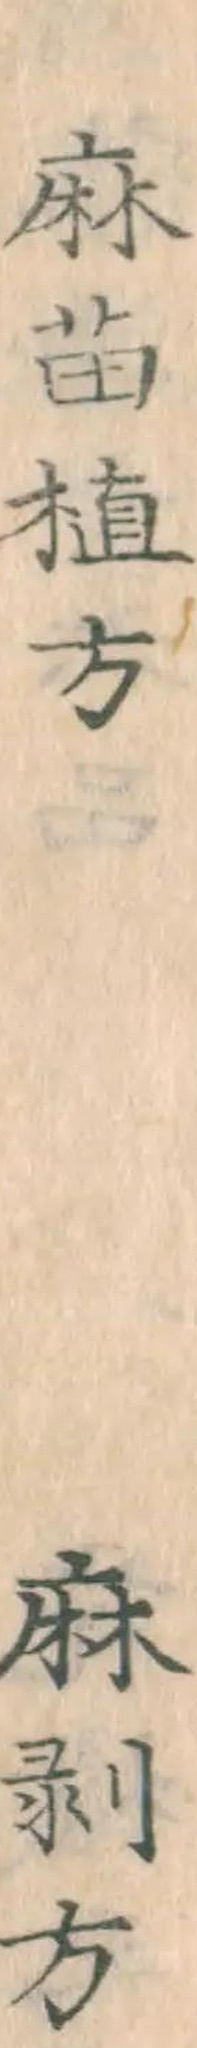麻苗植方麻剝方
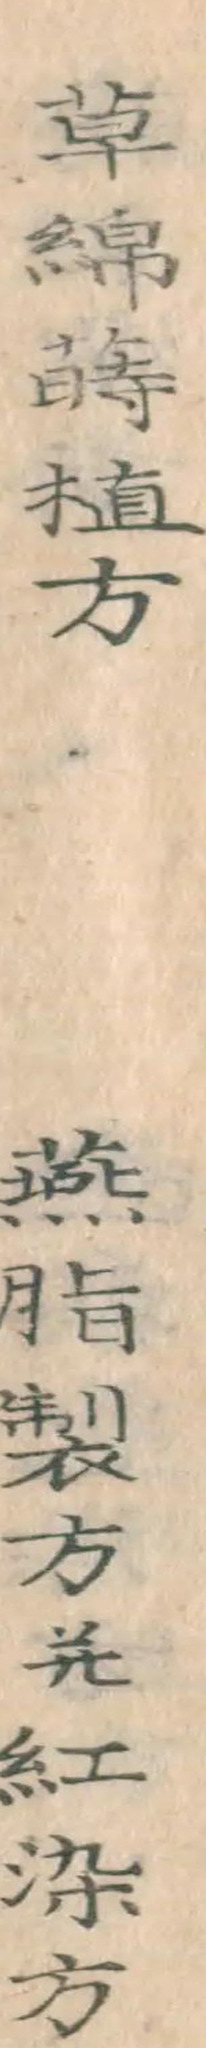草綿蒔植方燕脂製方幷紅染方

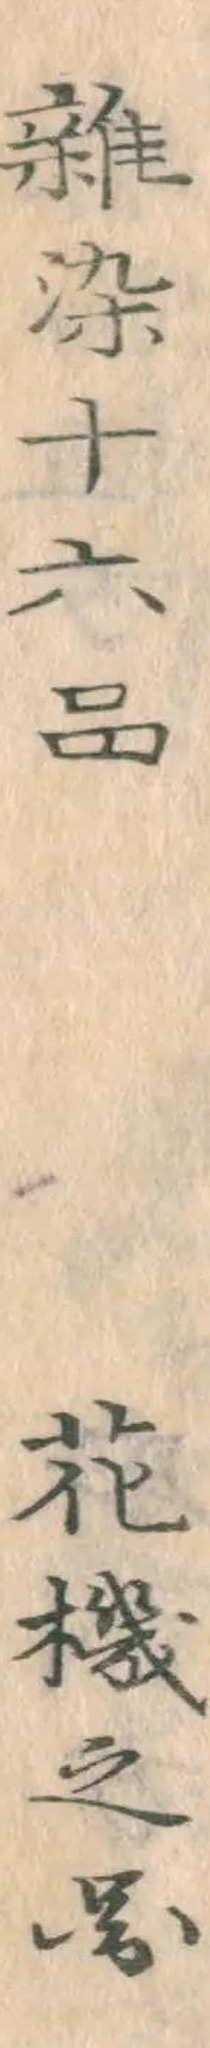雑染十六品花機之図
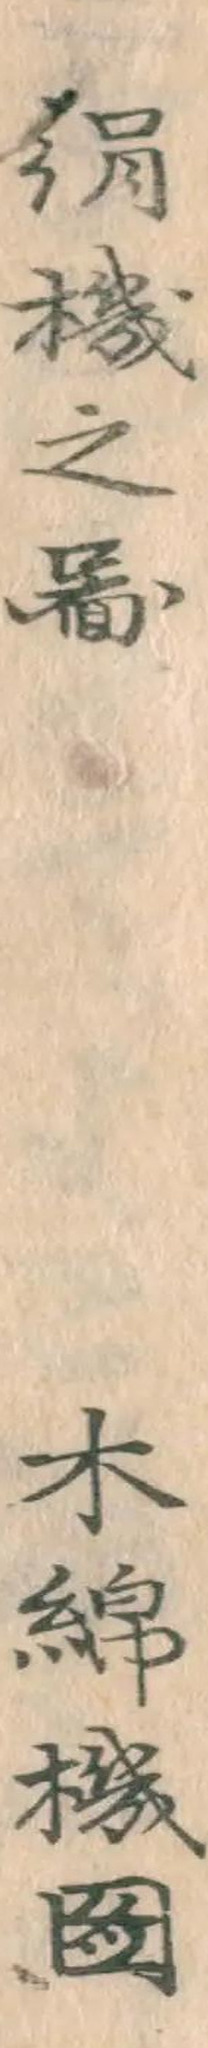絹機之図木綿機図
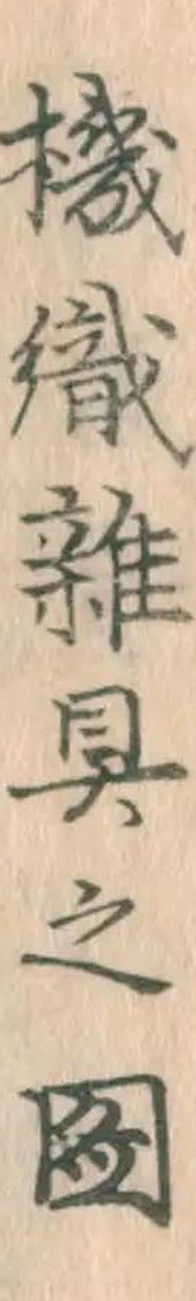機織雑具之図
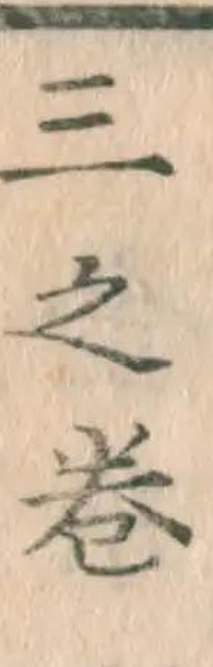三之巻
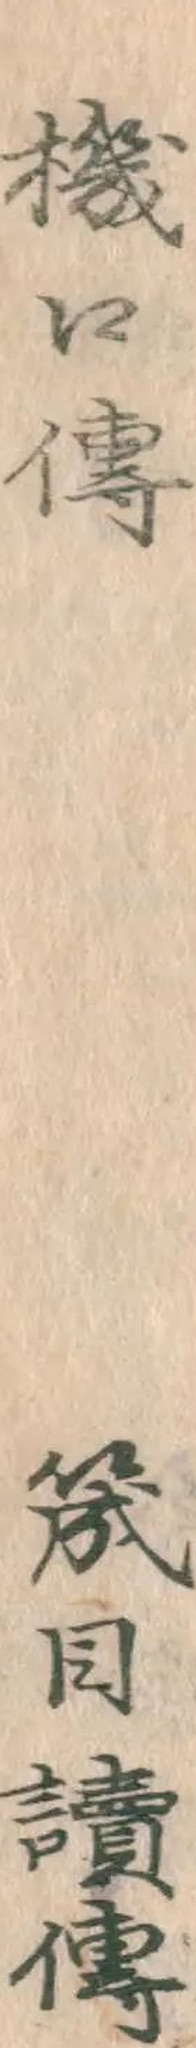機口伝筬目読伝
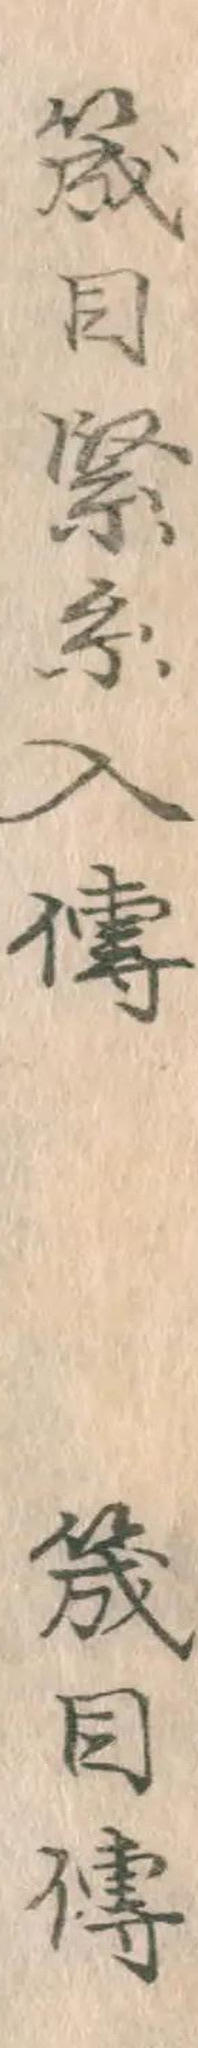筬目緊糸入伝筬目伝
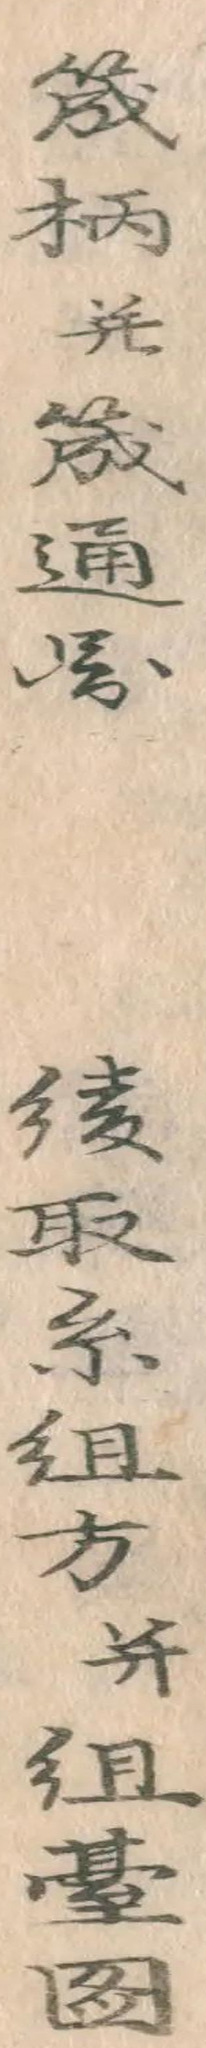筬柄幷筬通図綾取糸組方幷組台図
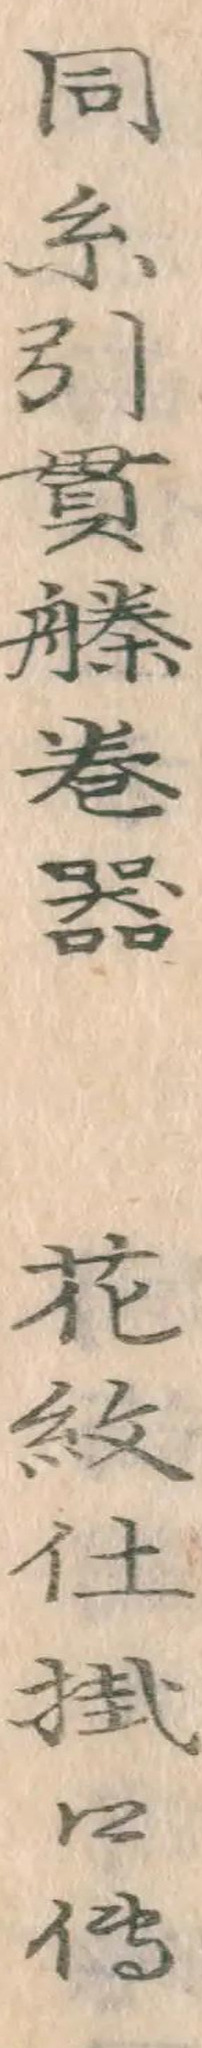同糸引貫𣚗巻器花紋仕掛口伝
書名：機織彙編 5巻. [1]
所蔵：国立国会図書館 National Diet Library, JAPAN
